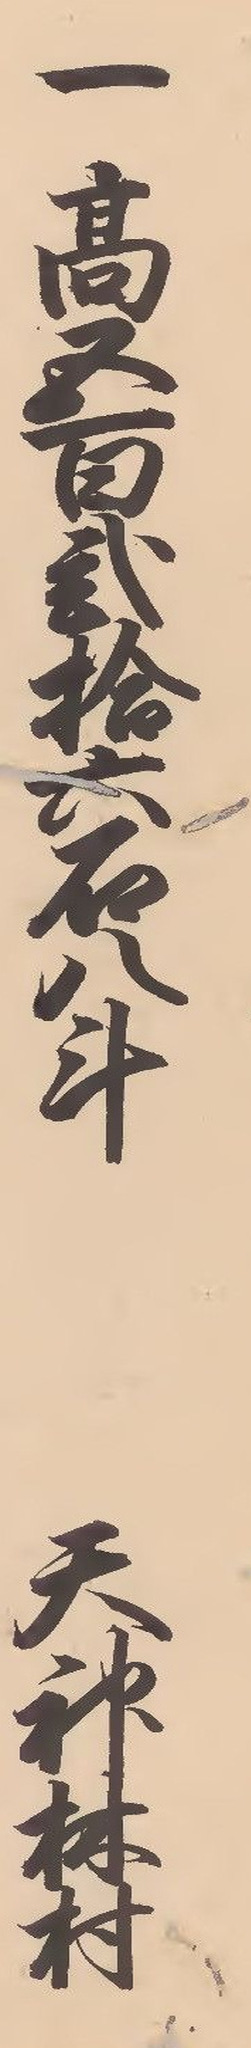一高五百弐拾六石八斗天神林村
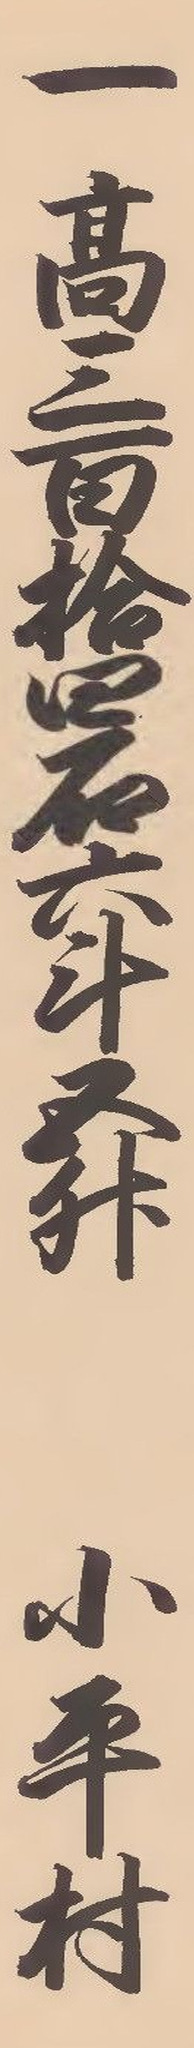一高三百拾四石六斗五升小平村
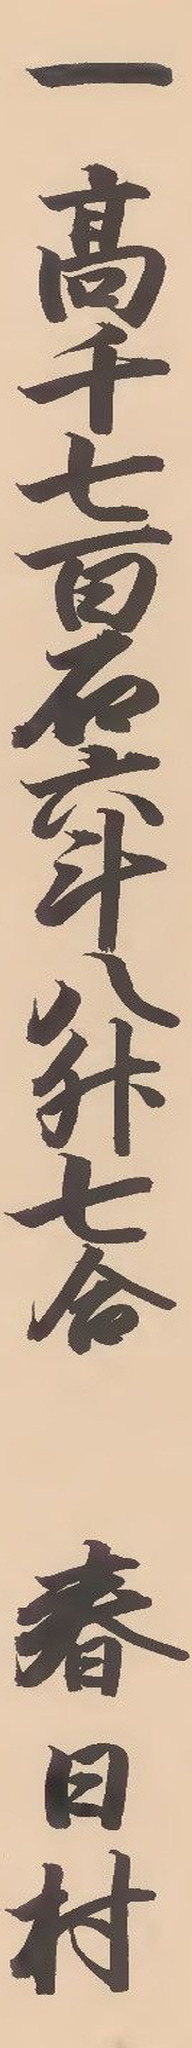一高千七百石六斗八升七合春日村
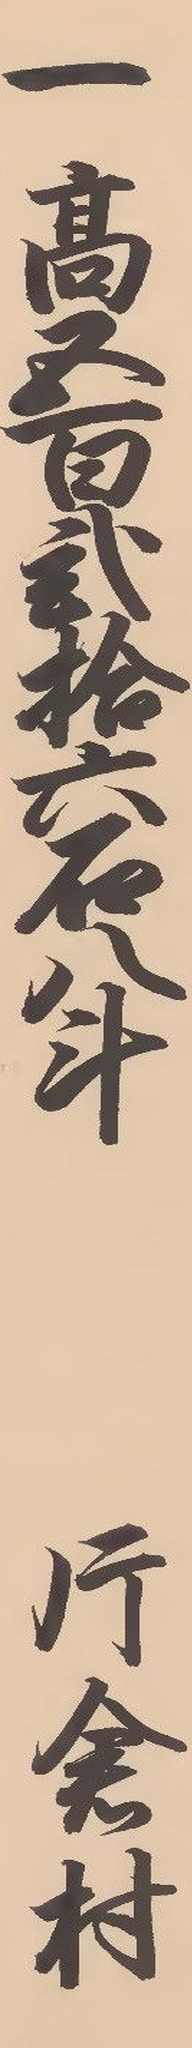一高五百弐拾六石八斗片倉村
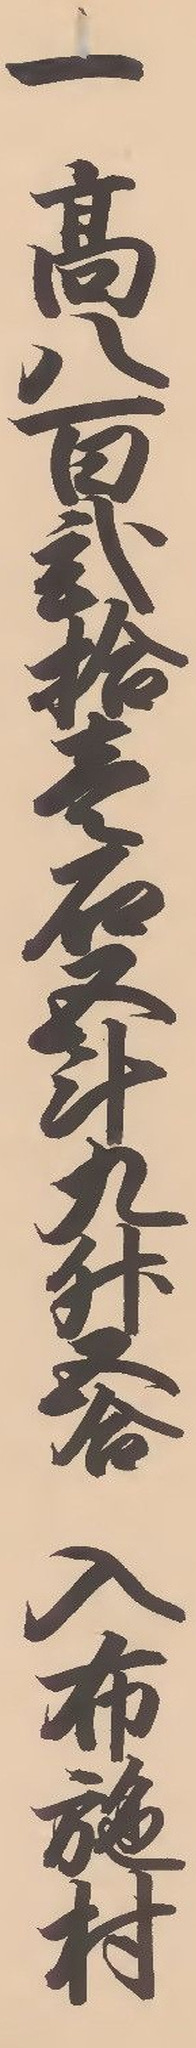一高八百弐拾壱石五斗九升五合入布施村
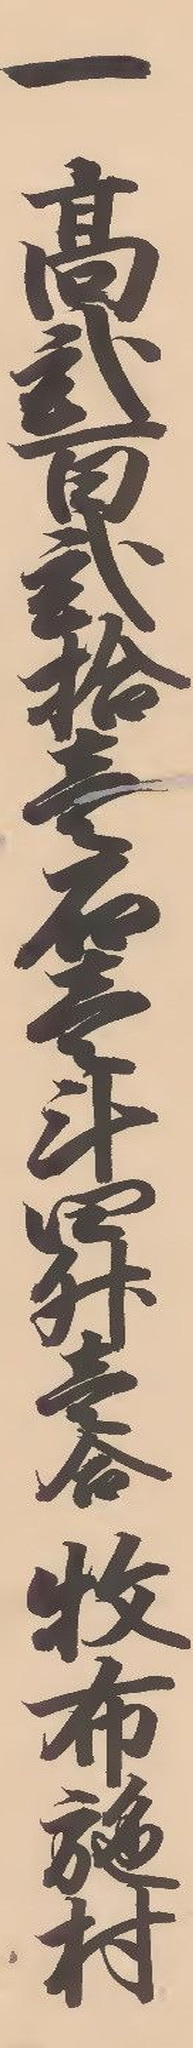一高弐百弐拾壱石壱斗四升壱合牧布施村

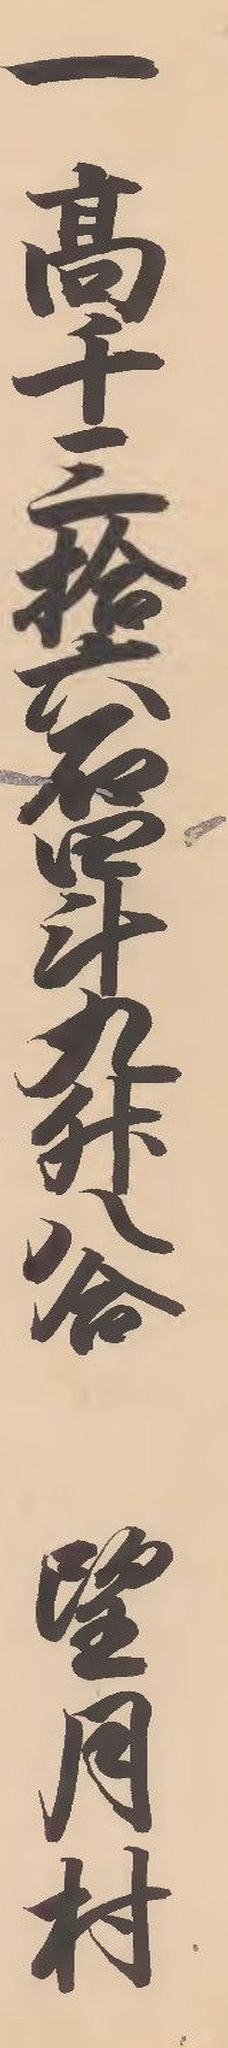一高千三拾六石四斗九升八合望月村
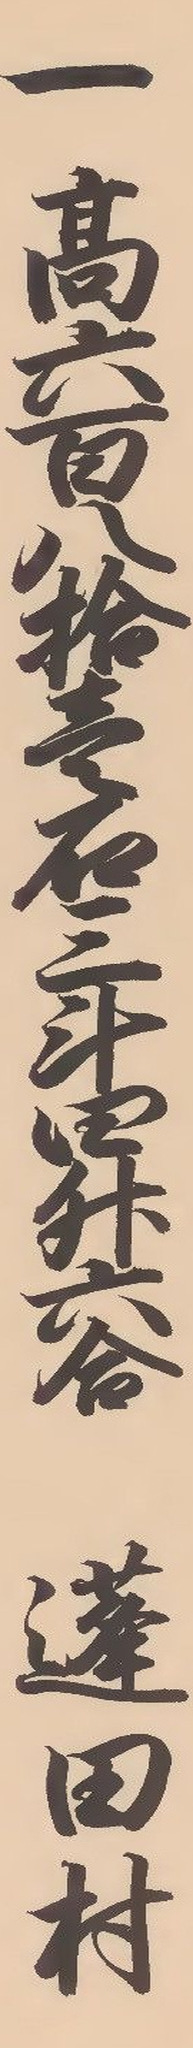一高六百八拾壱石三斗四升六合蓬田村
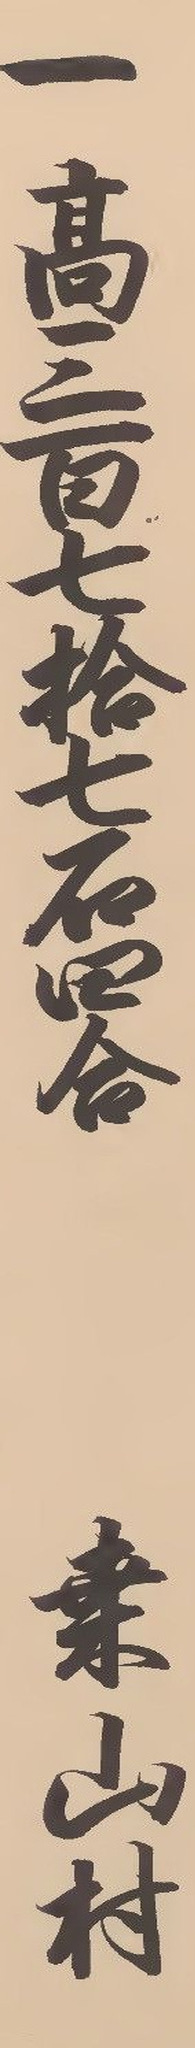一高三百七拾七石四合桑山村
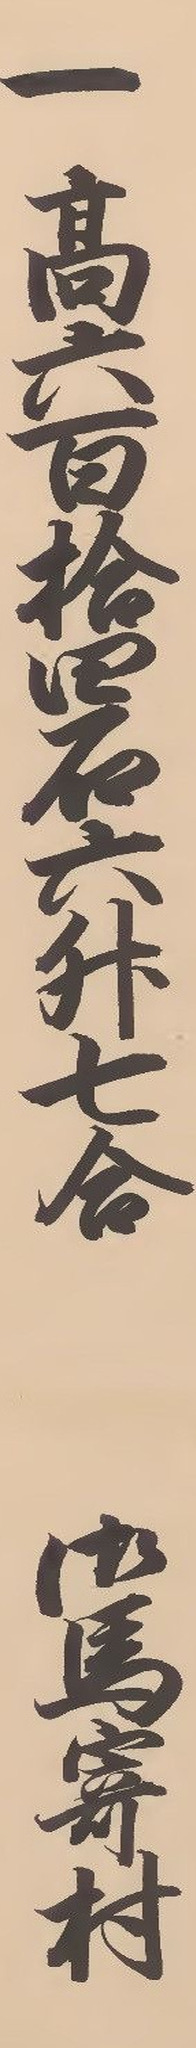一高六百拾四石六升七合御馬寄村
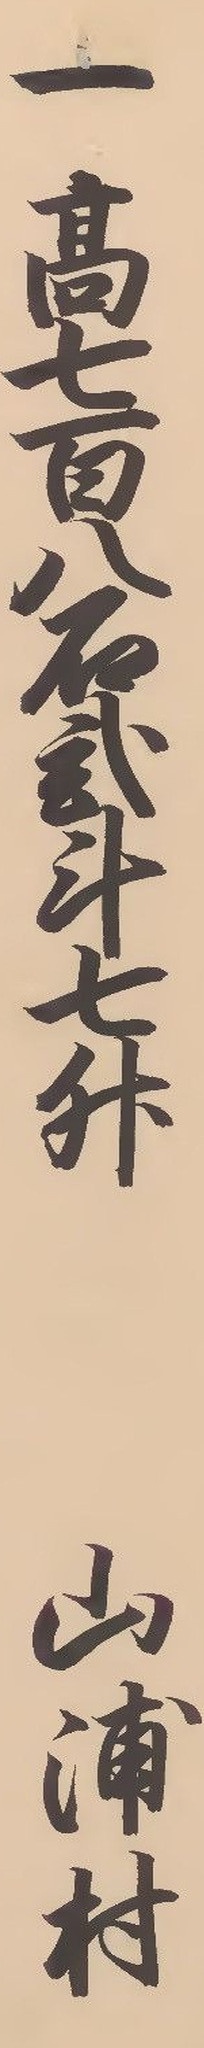一高七百八石弐斗七升山浦村
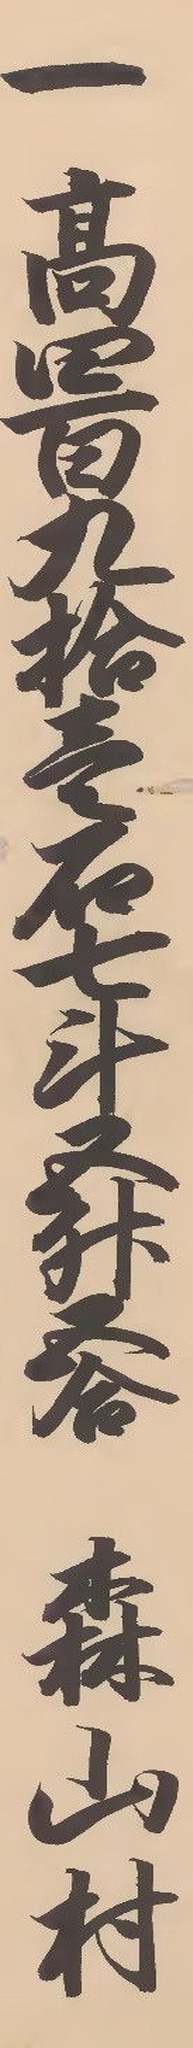一高四百九拾壱石七斗五升五合森山村

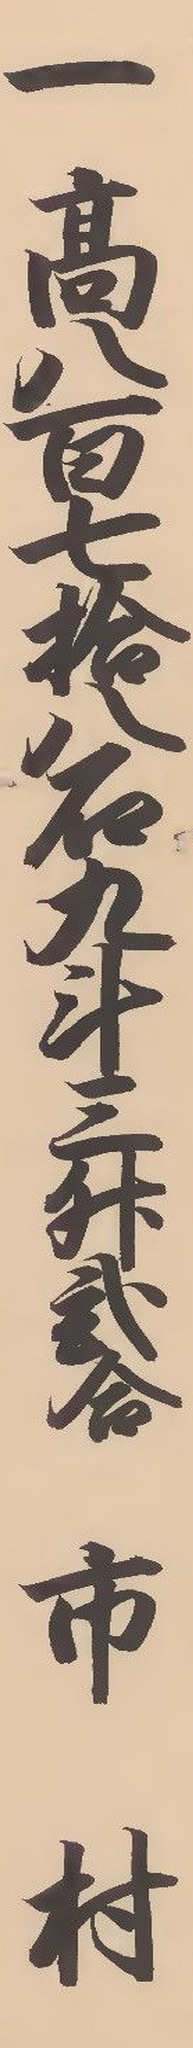一高八百七拾八石九斗三升弐合市村
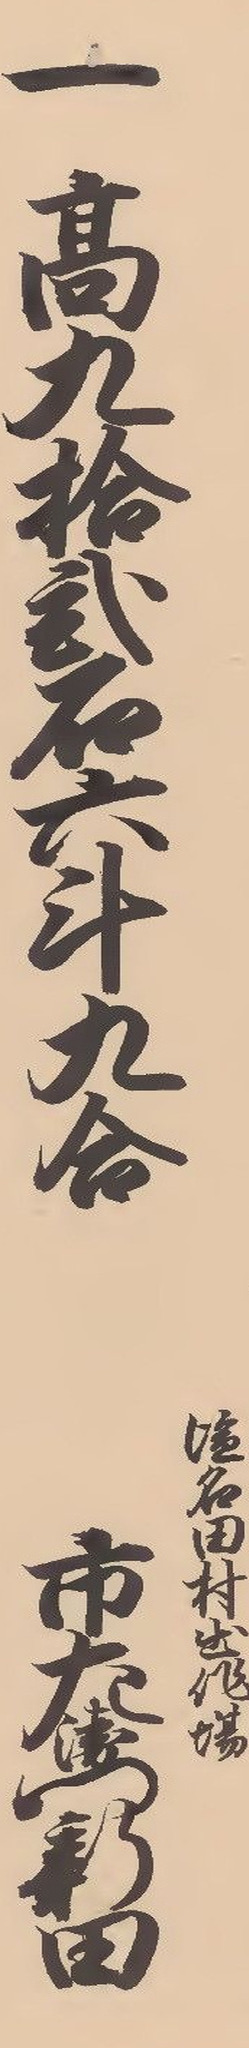一高九拾弐石六斗九合市左衛門新田
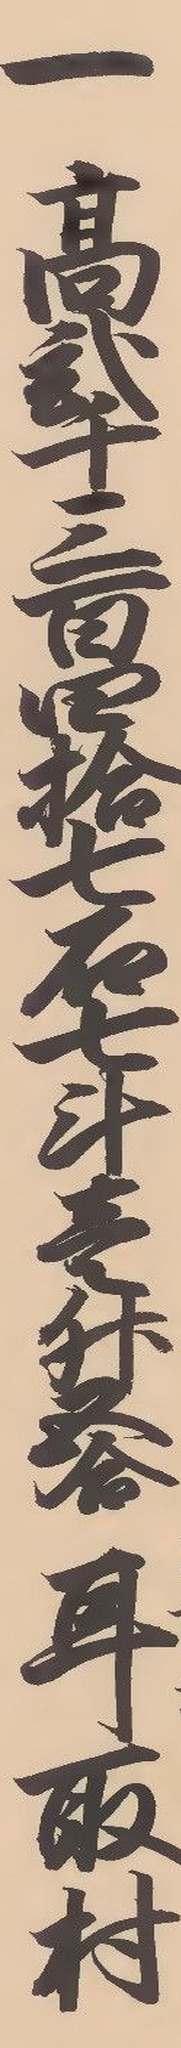一高弐千三百四拾七石七斗壱升五合耳取村
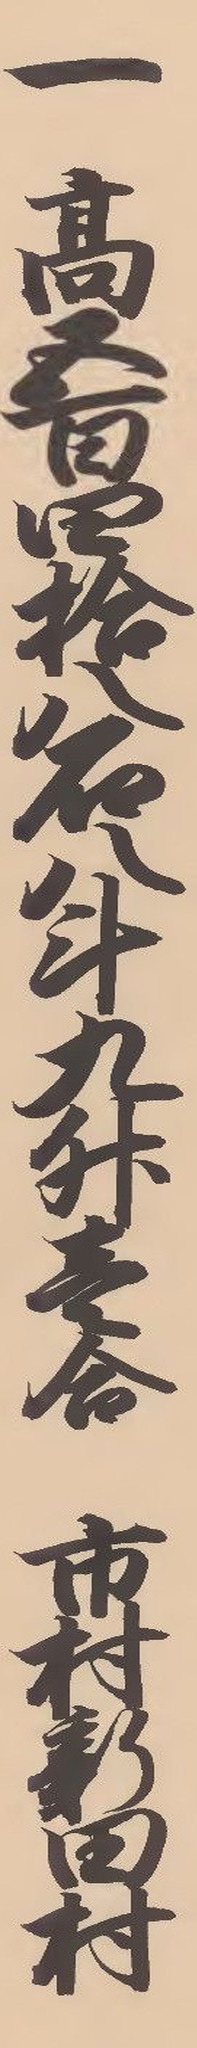一高五百四拾八石八斗九升壱合市村新田村
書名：信濃国郷帳
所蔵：国立公文書館 National Archives of Japan
